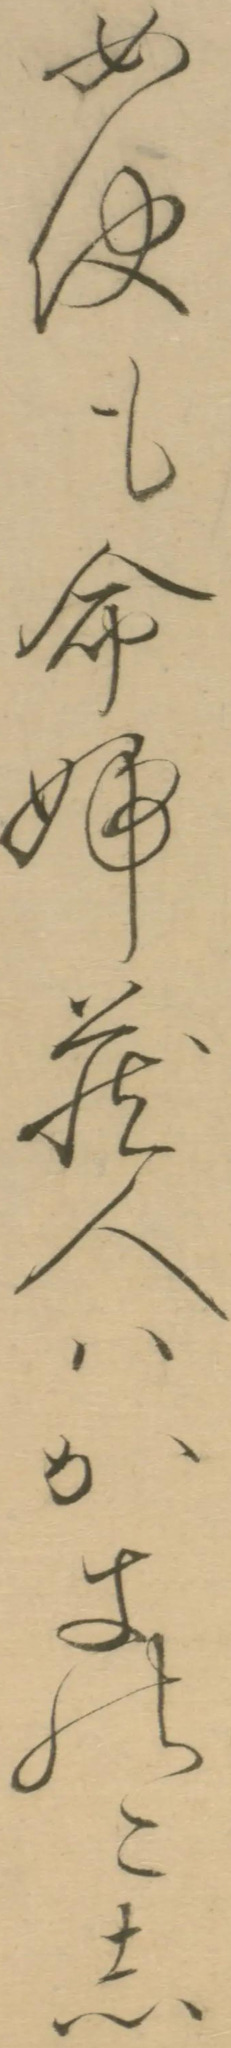女使も命婦蔵人はかきのこし
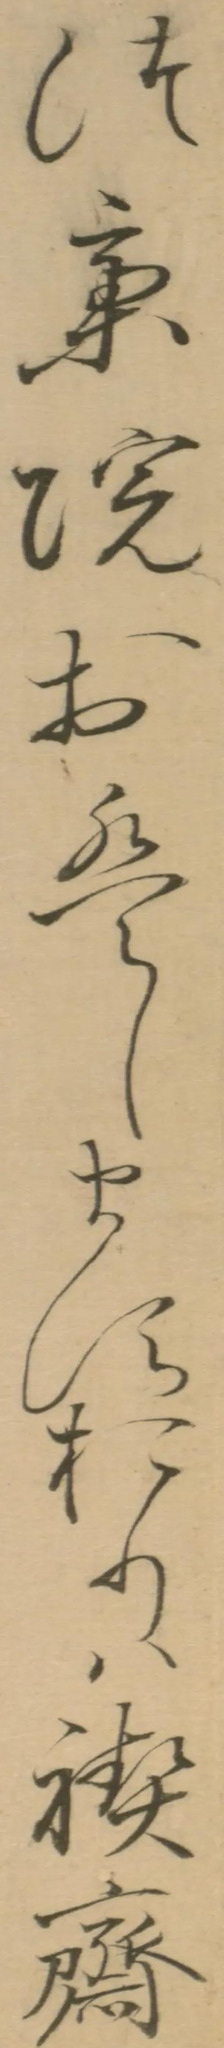つ斎院おはしますおりは禊斎
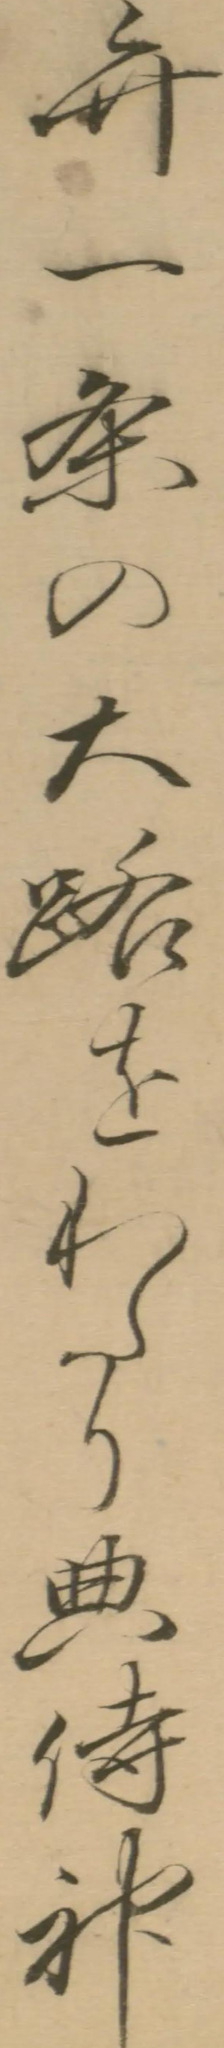弁一条の大路をわたり典侍神
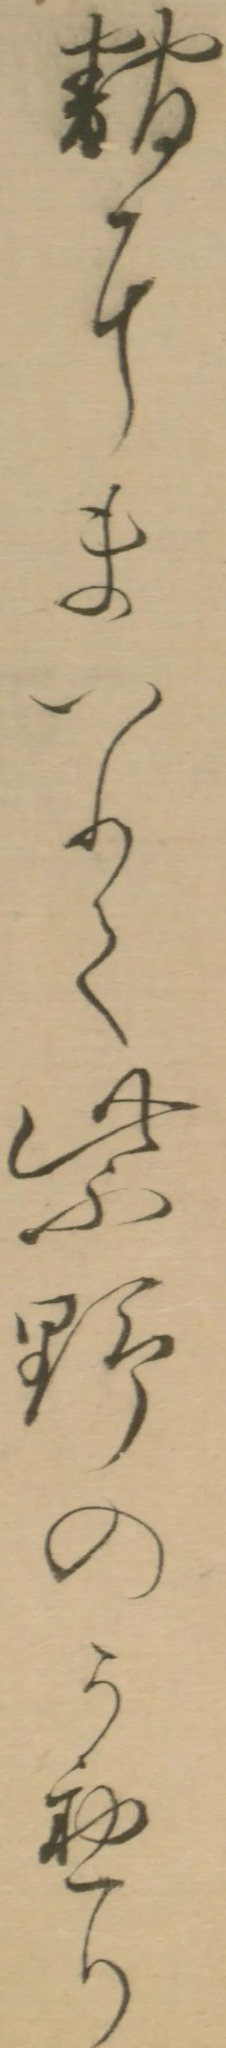館にまいりて紫野のかへり

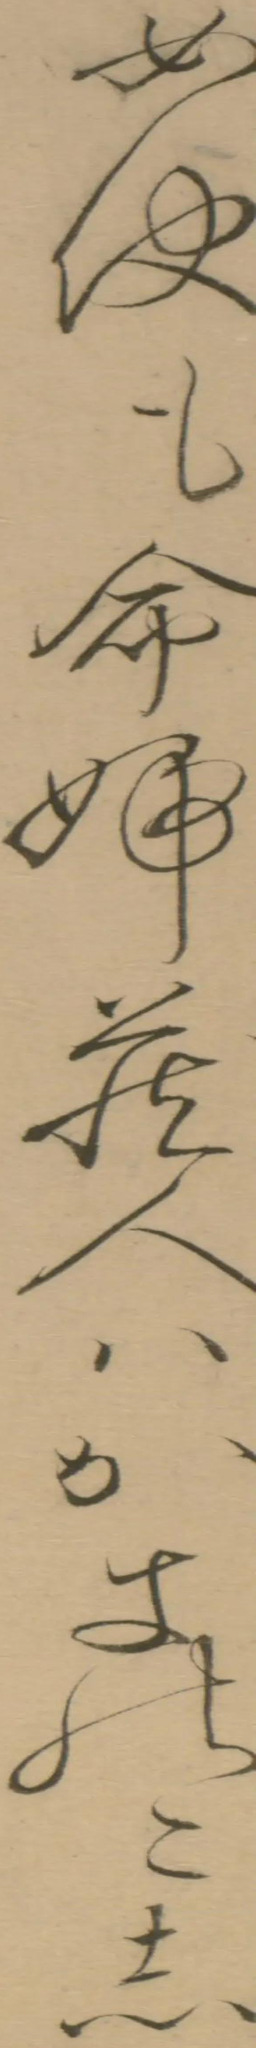女使も命婦蔵人はかきのこし
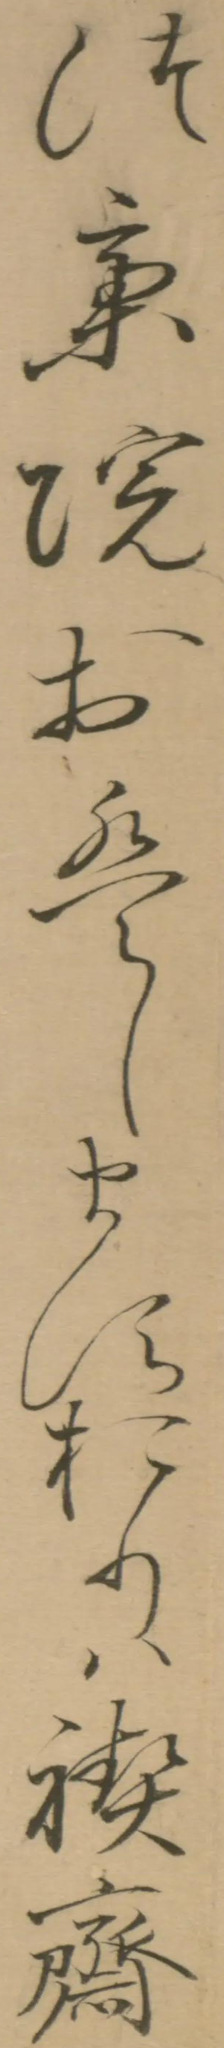つ斎院おはしますおりは禊斎
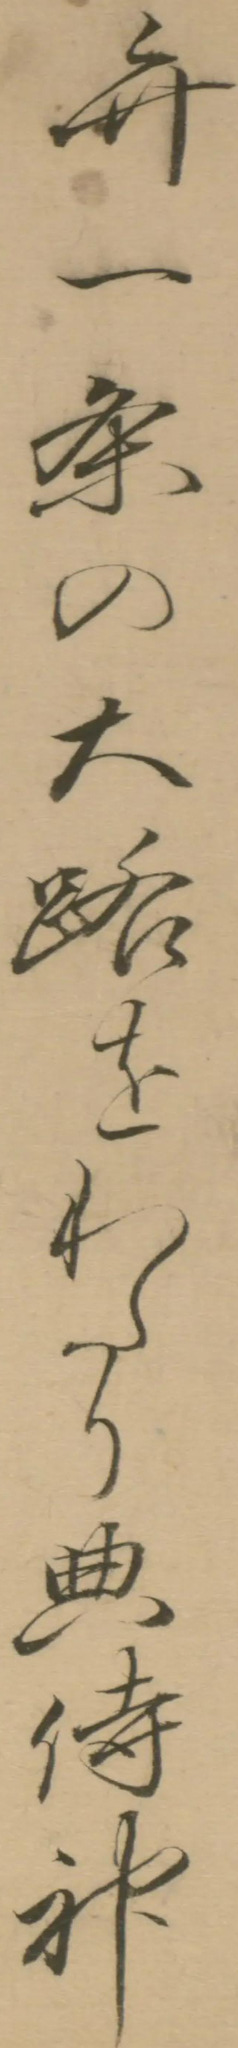弁一条の大路をわたり典侍神
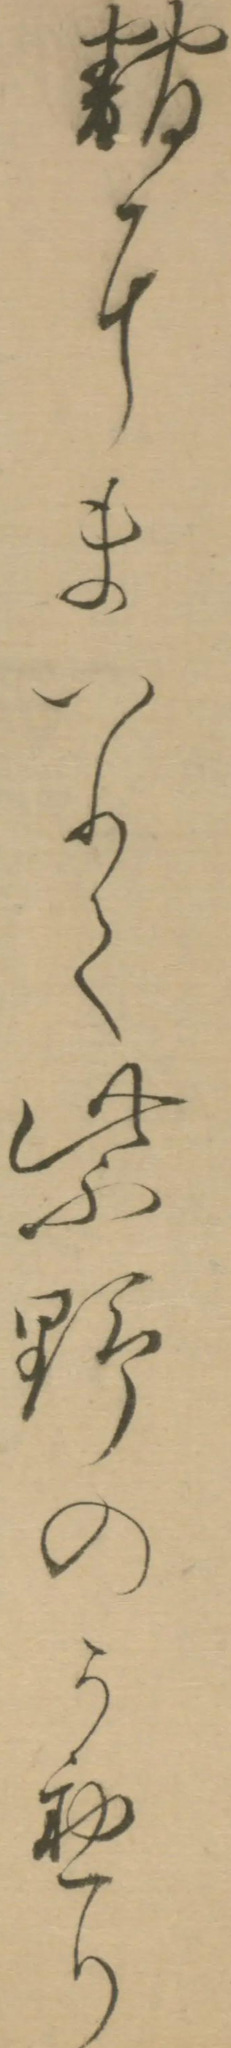館にまいりて紫野のかへり
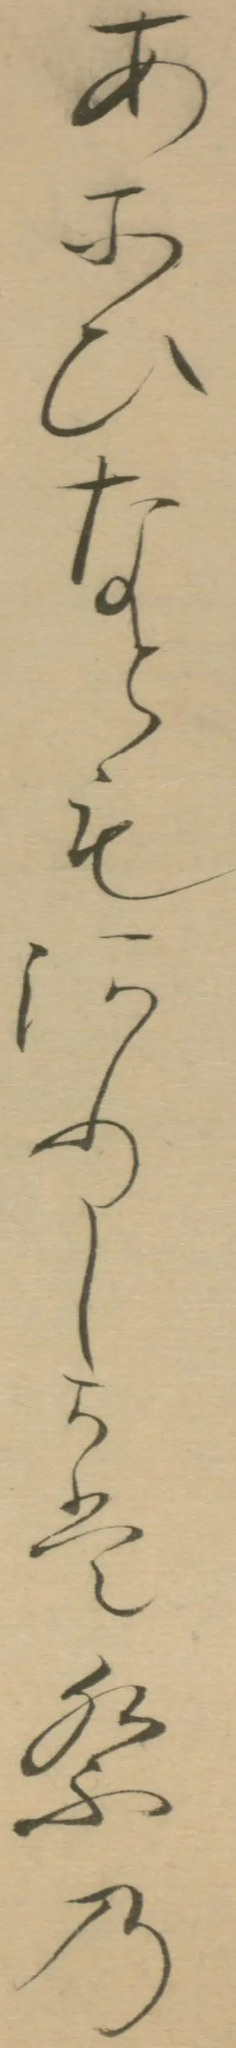あそひなともありしかは祭の
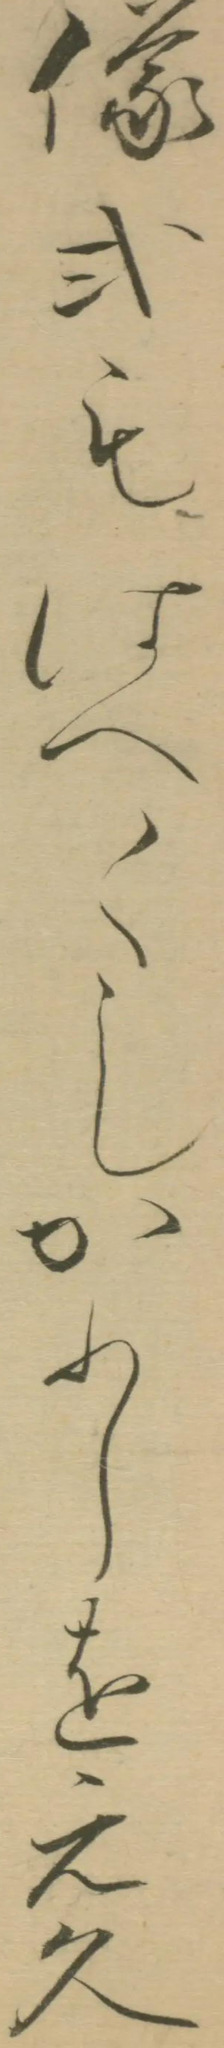儀式もはへ〳〵しかりしを元久
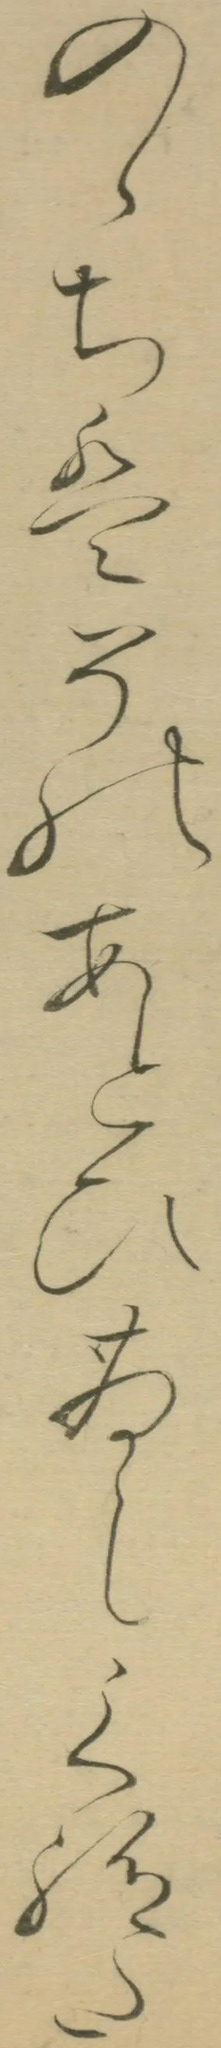のゝちはそのあとひさしく絶た
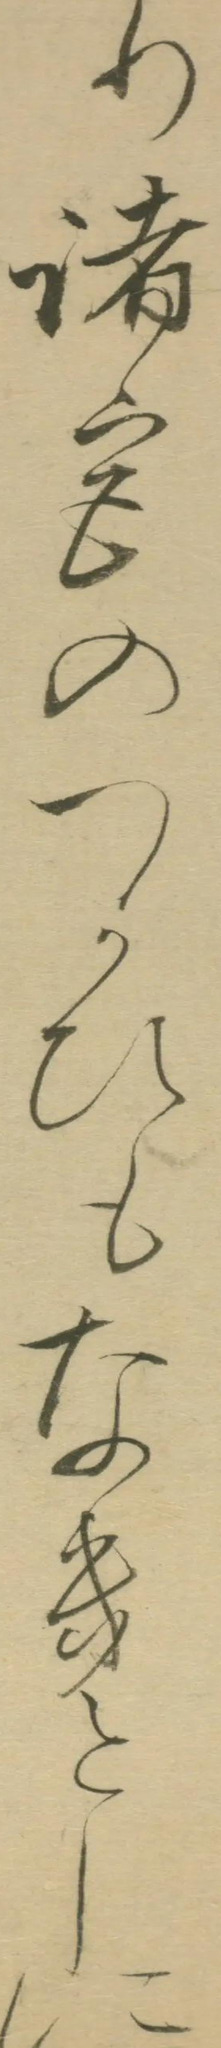り諸宮のつかひもなきとしに
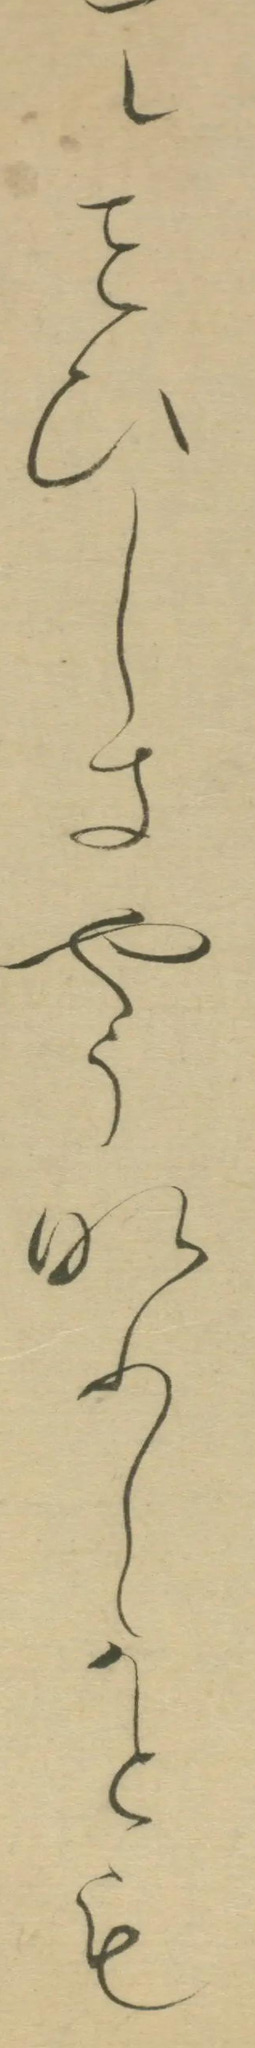てさひしきやうなりしかとも
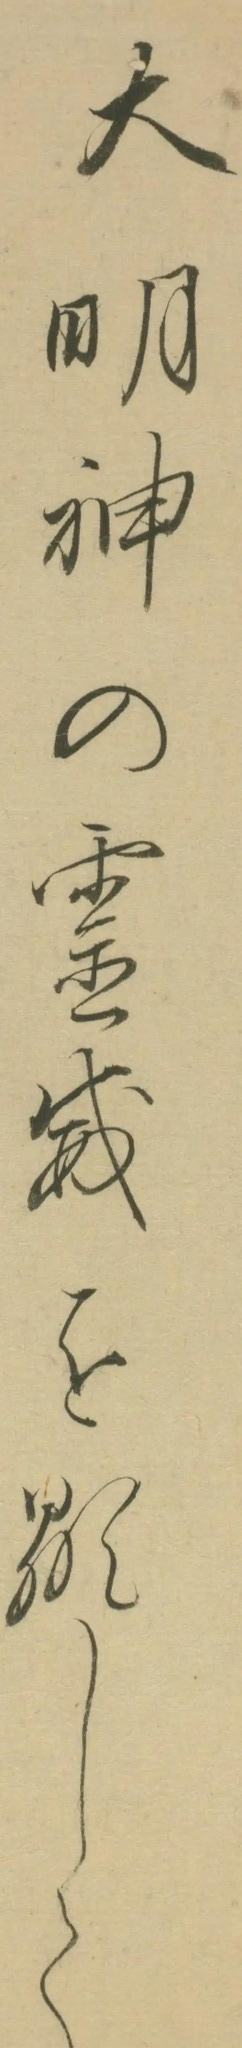大明神の霊威を顕して
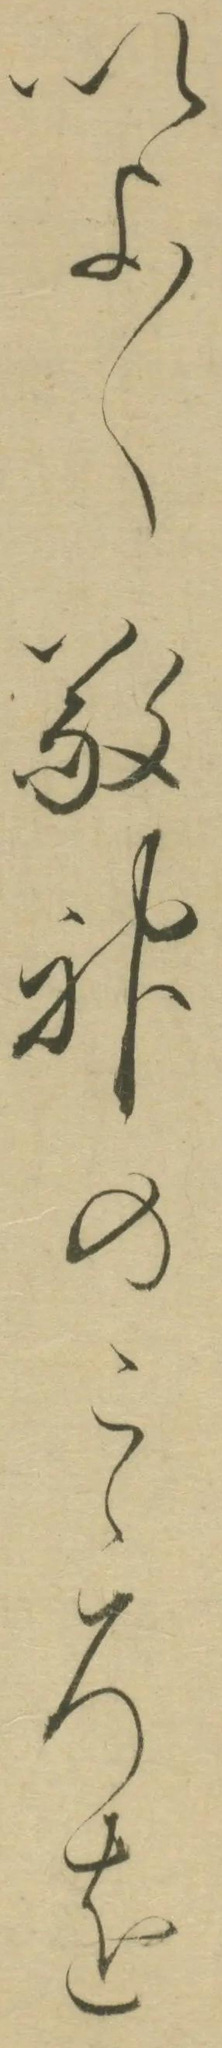いよ〳〵敬神のこゝろを
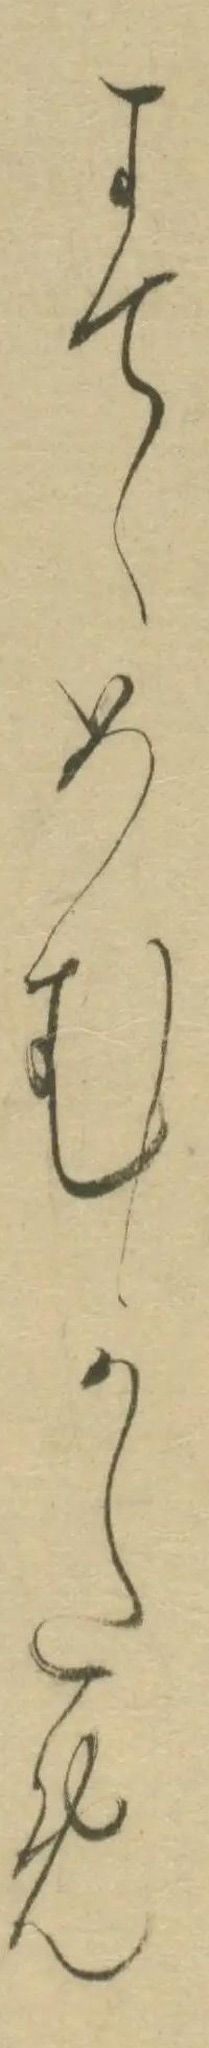すゝめむかため
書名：文永賀茂祭図. [2]
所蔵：国立国会図書館 National Diet Library, JAPAN
